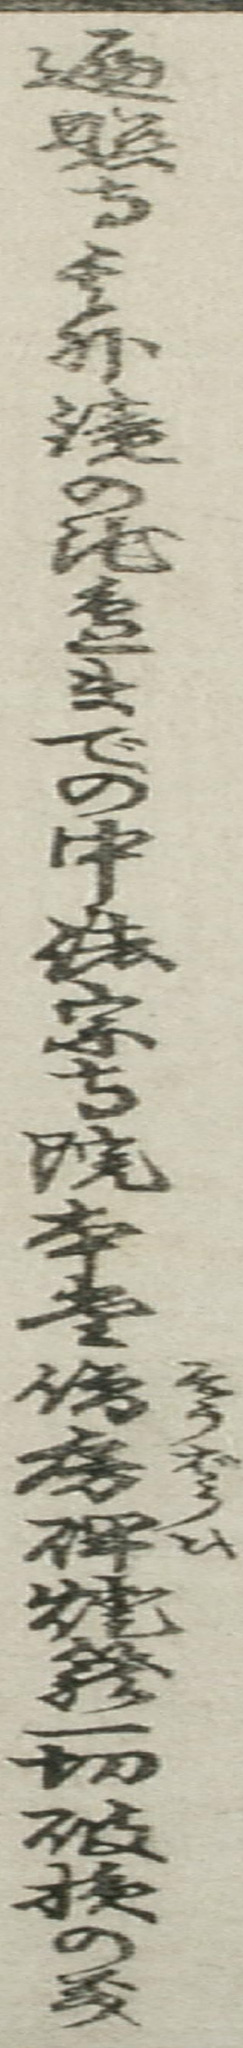遍照寺其外鏡の池辺までの中諸宗寺院本堂僧房碑燈籠一切破損の義
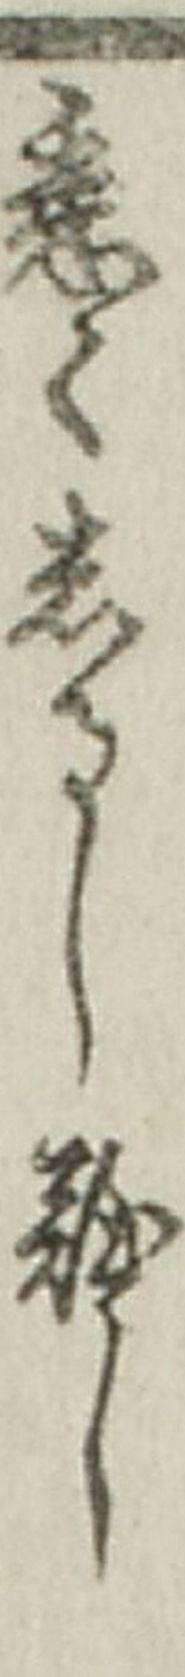悉くしるし難し
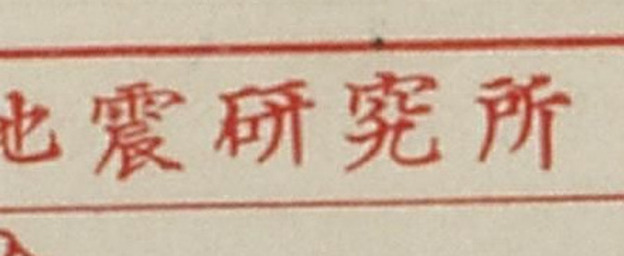地震研究所
